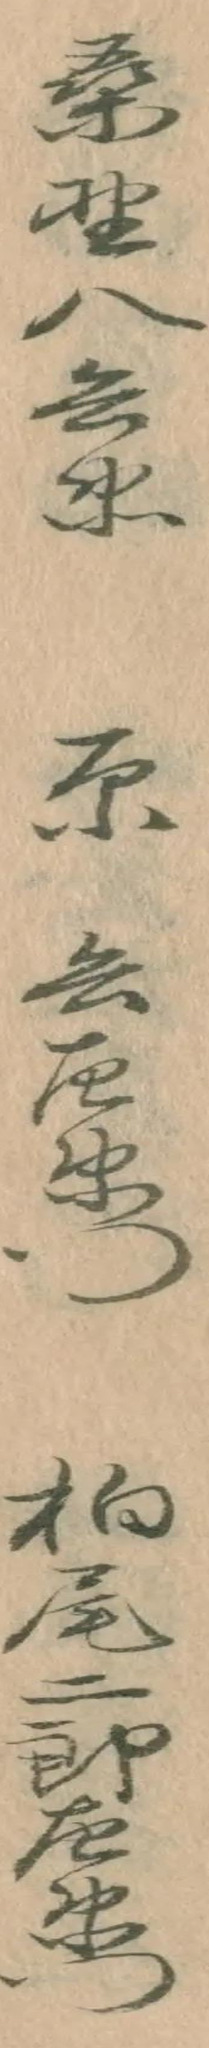桑野八兵衛原兵左衛門柏尾二郎左衛門
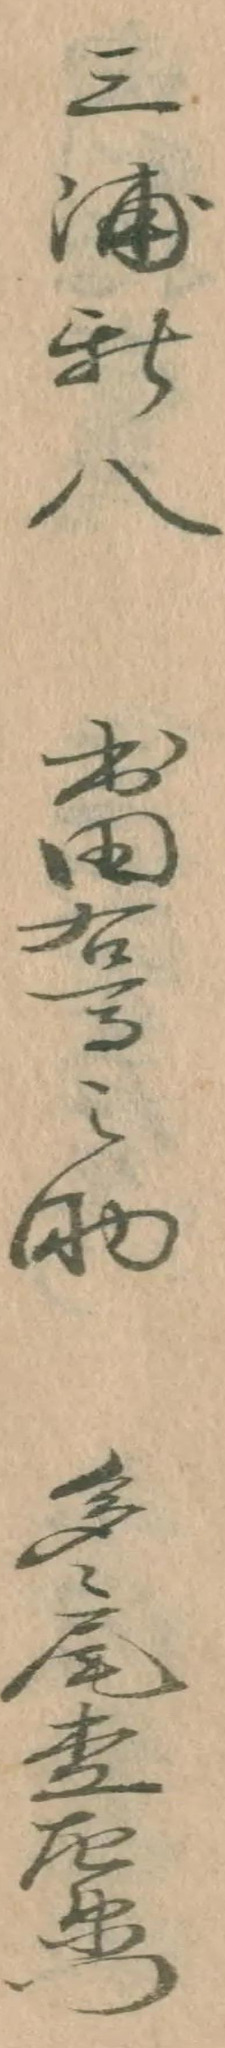三浦新八出田右馬之助多々尾杢左衛門
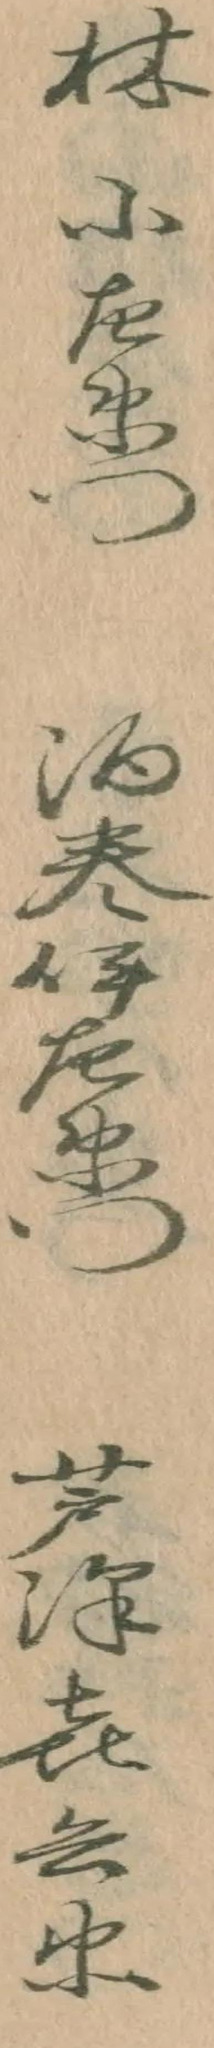林小左衛門酒巻伊左衛門芦沢喜兵衛
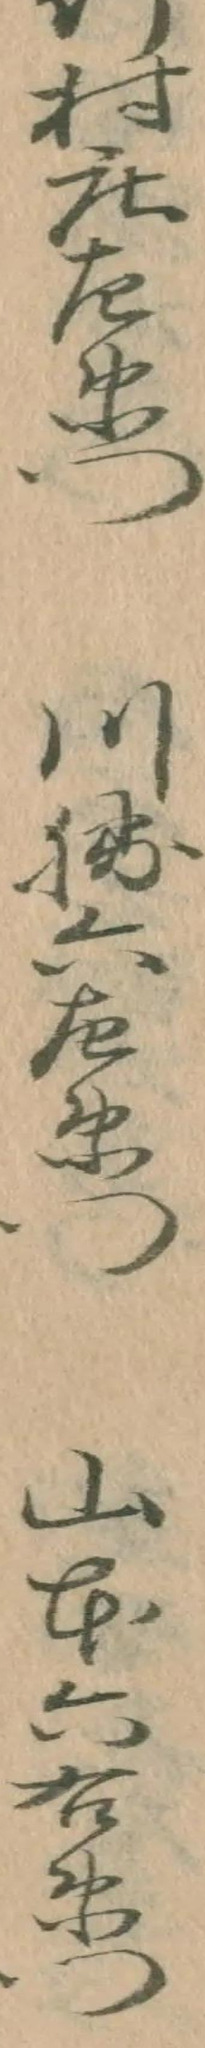竹村庄左衛門川勝六左衛門山本六右衛門
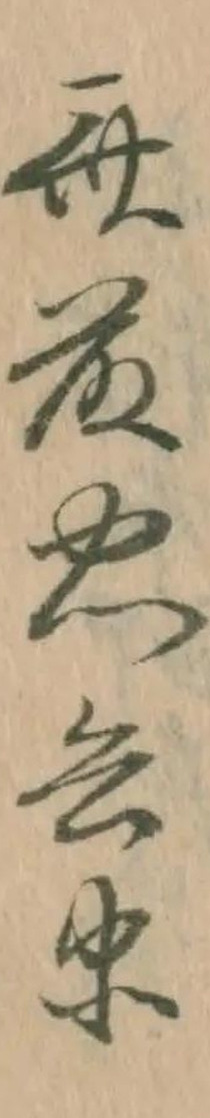斎藤忠兵衛
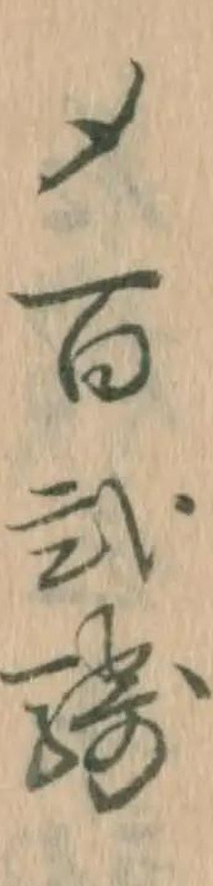〆百弐騎
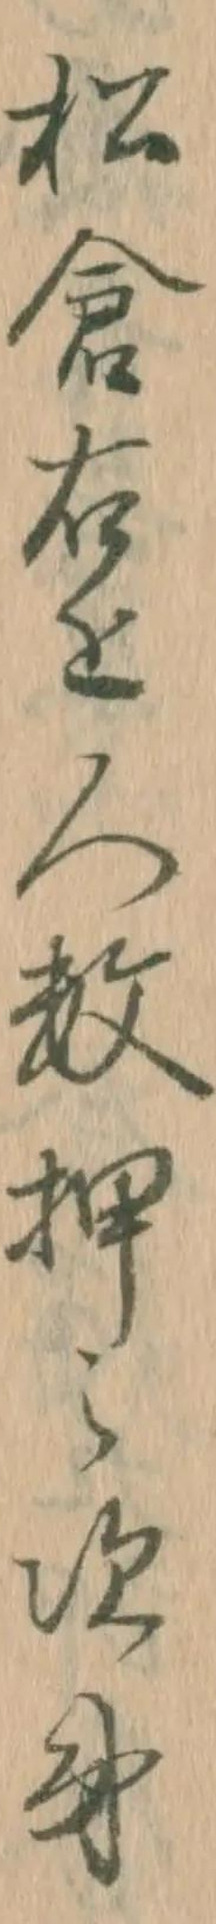松倉右近人数押之次第
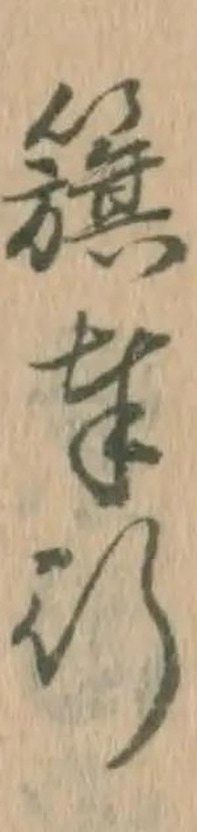籏奉行
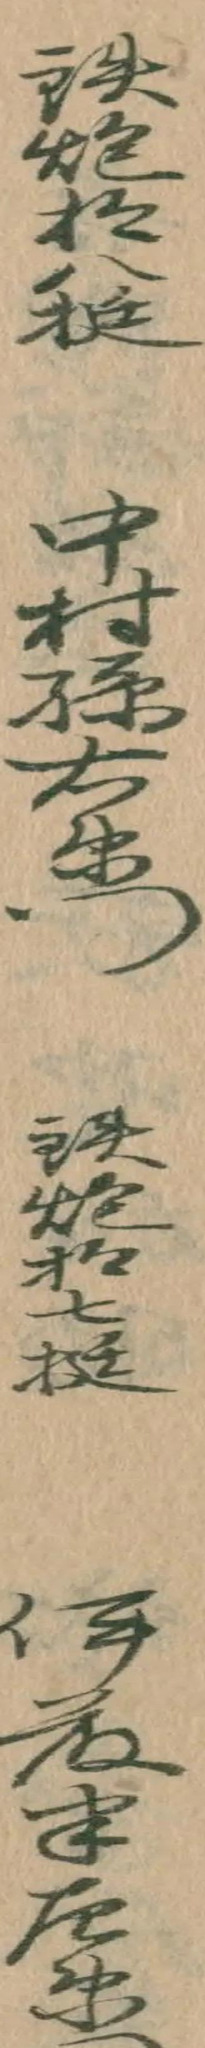鉄炮拾八挺中村孫右衛門鉄炮拾七挺伊藤半左衛門
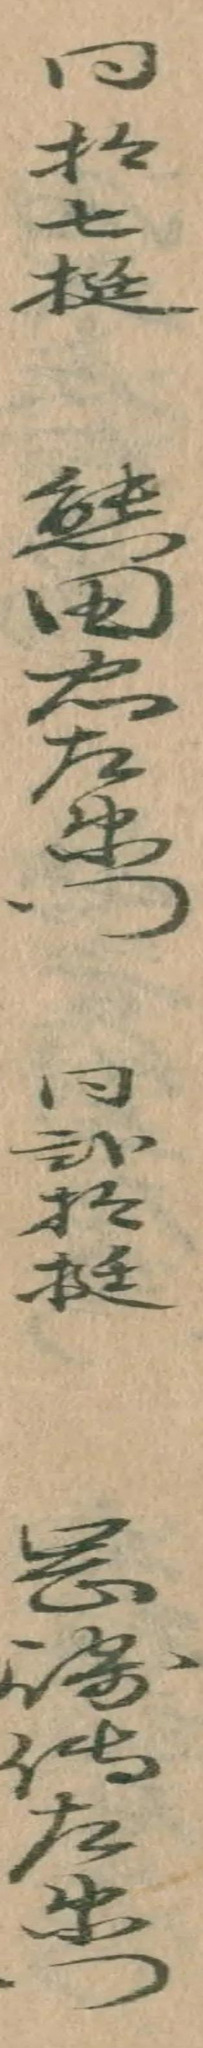同拾七挺熊田忠左衛門同弐拾挺岡崎伝左衛門
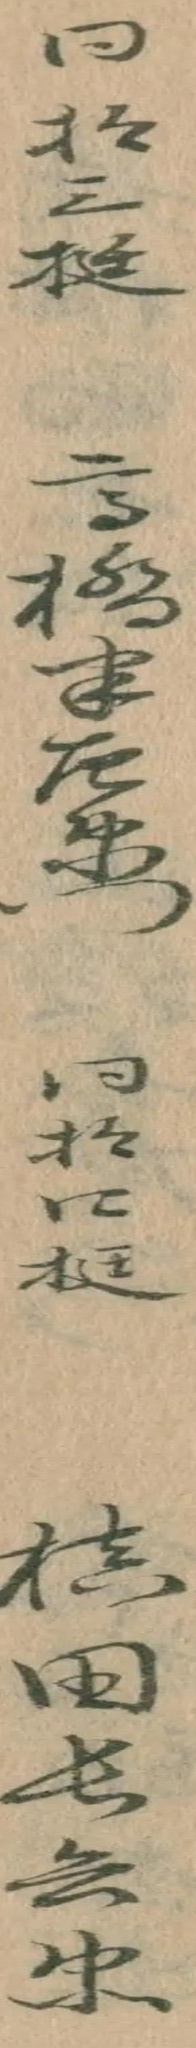同拾三挺高橋半左衛門同拾四挺槙田長兵衛
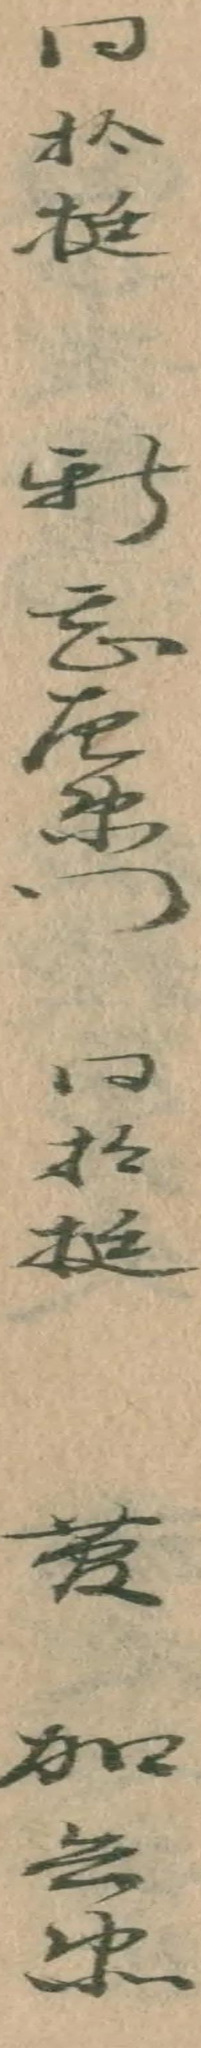同拾挺新甚左衛門同拾挺管加兵衛
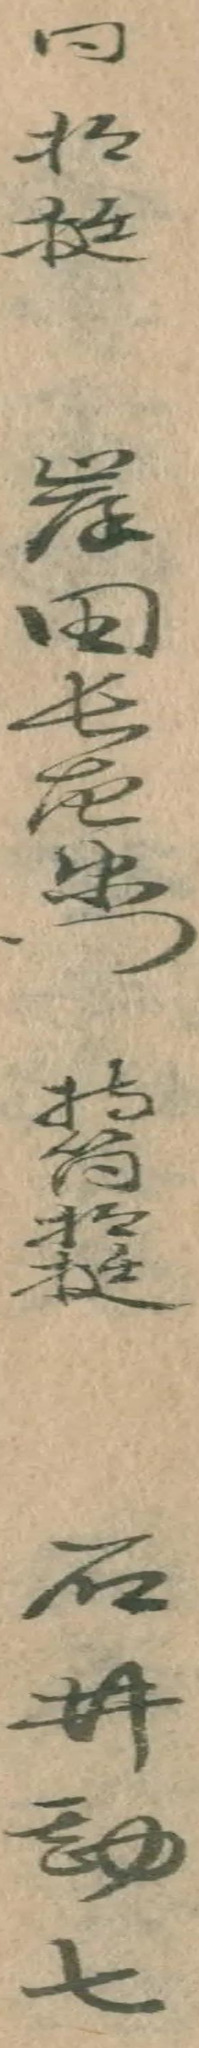同拾挺岸田長左衛門持筒拾挺石井勘七
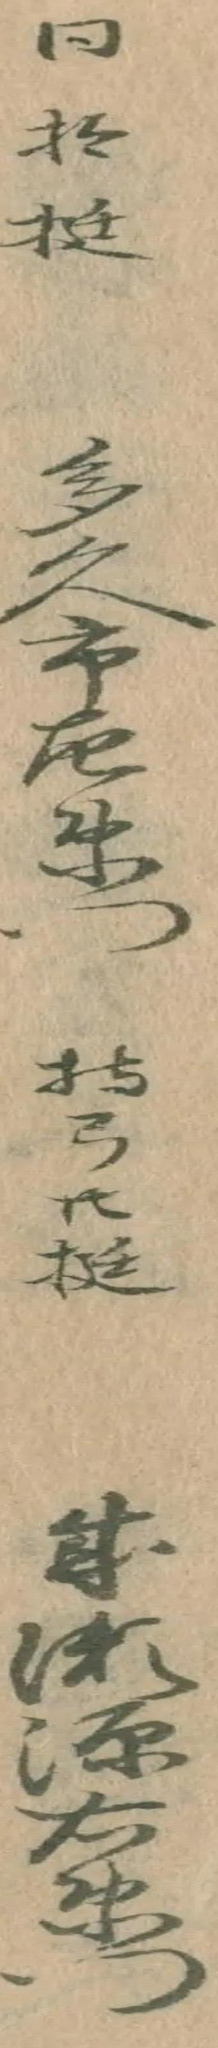同拾挺多久市左衛門持弓廿挺成瀬源右衛門
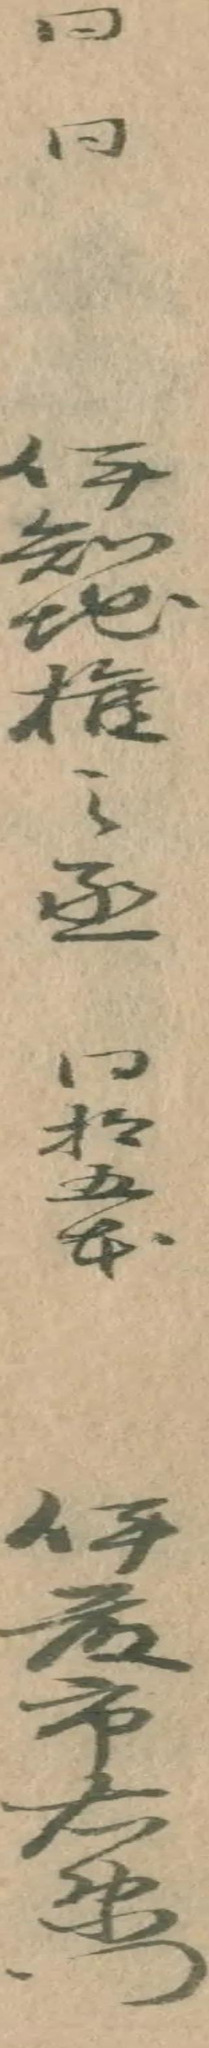同同伊知地権之丞同拾五本伊藤市右衛門
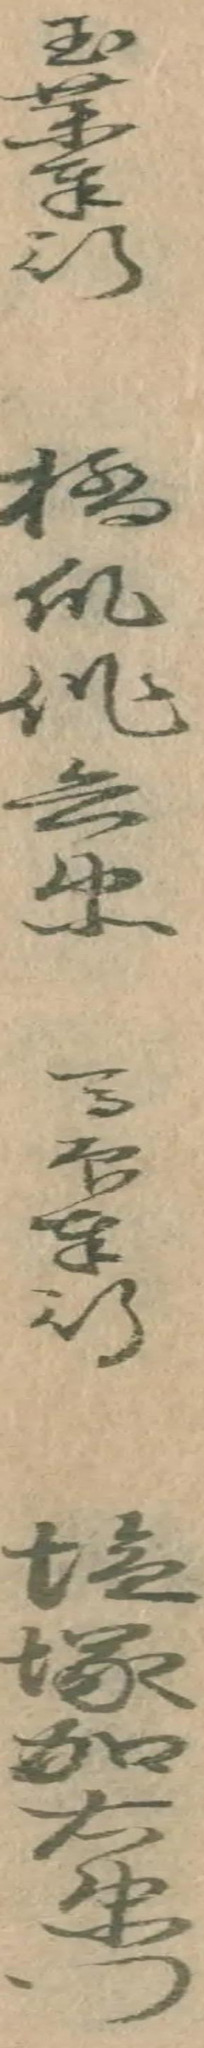玉薬奉行橋爪作兵衛馬印奉行塩塚加右衛門
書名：切支丹御退治記 49巻. [3]
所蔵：国立国会図書館 National Diet Library, JAPAN
